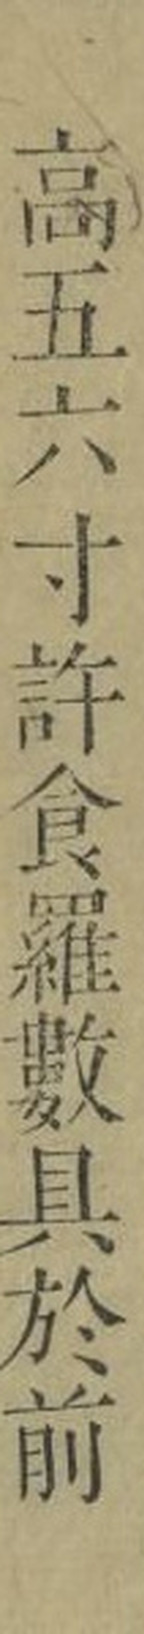高五六寸許食羅数具於前
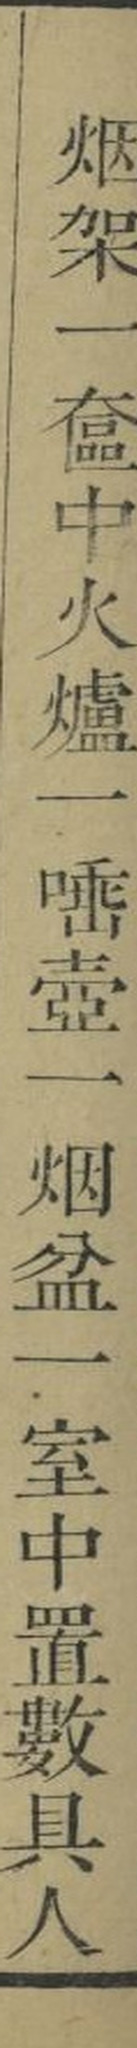煙架一奩中火炉一唾壺一煙盆一室中置数具人
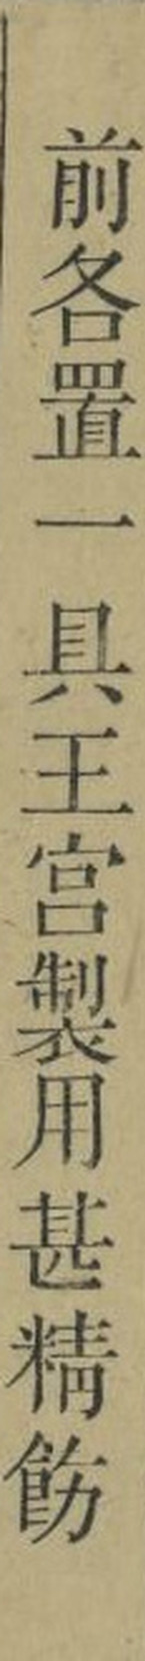前各置一具王宮製用甚精飭

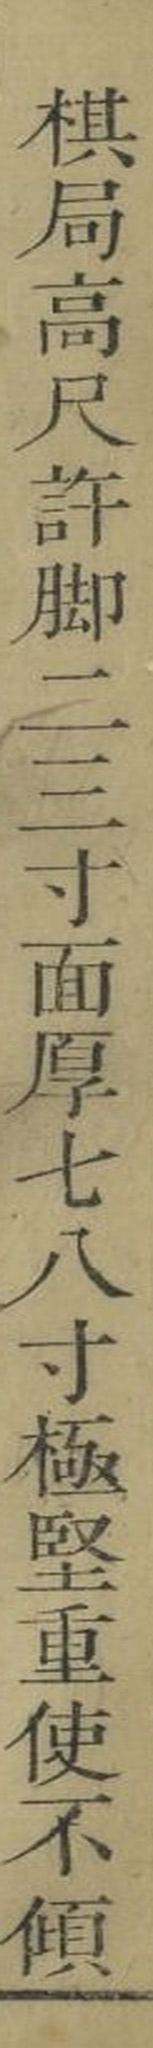棋局高尺許脚二三寸面厚七八寸極堅重使不傾
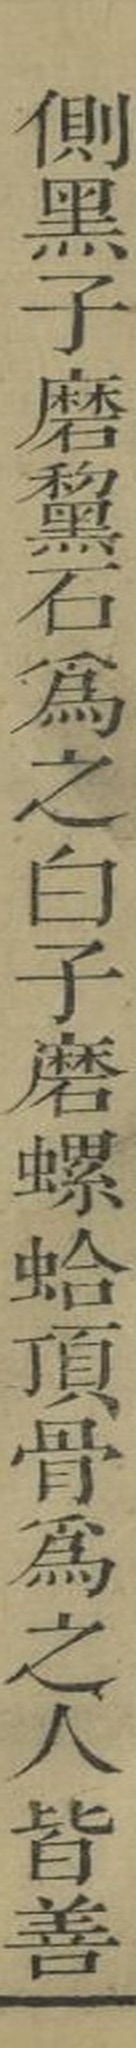側黒子磨黧石為之白子磨螺蛤頂骨為之人皆善
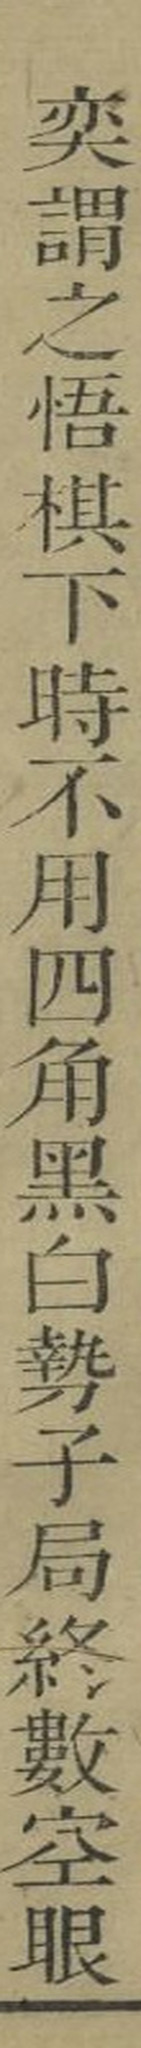奕謂之悟棋下時不用四角黒白勢子局終数空眼
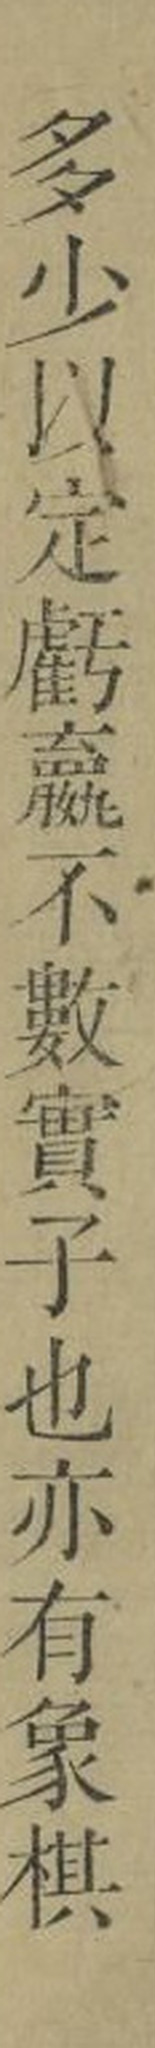多少以定虧嬴不数実子也亦有象棋
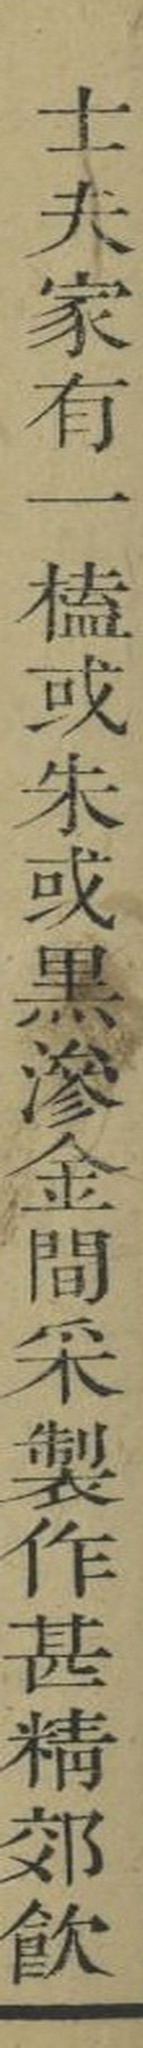士夫家有一榼或朱或黒滲金間采製作甚精郊飲
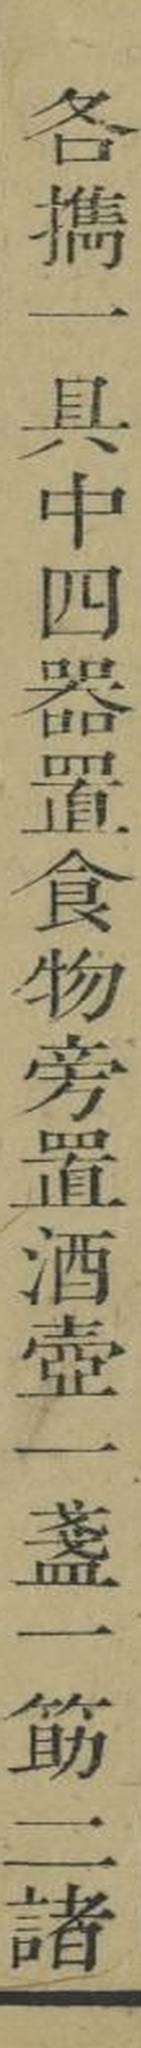各携一具中四器置食物旁置酒壺一盞一筯二諸
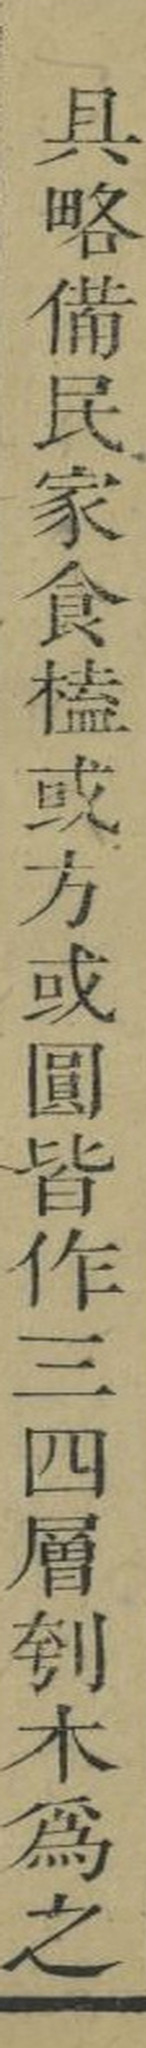具略備民家食榼或方或円皆作三四層刳木為之

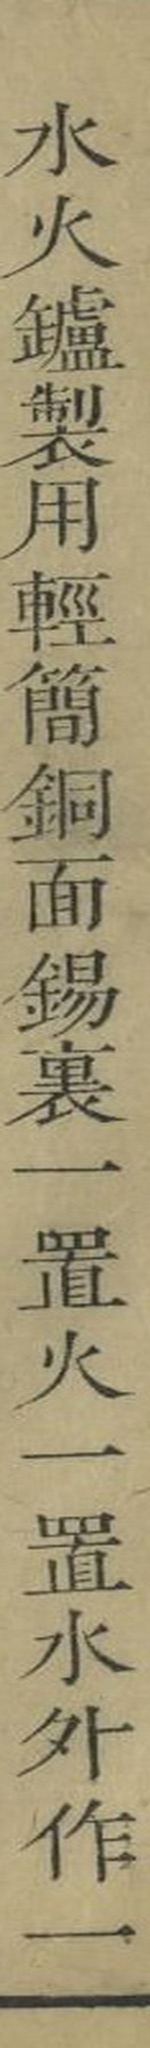水火罏製用軽簡銅面錫裏一置火一置水外作一
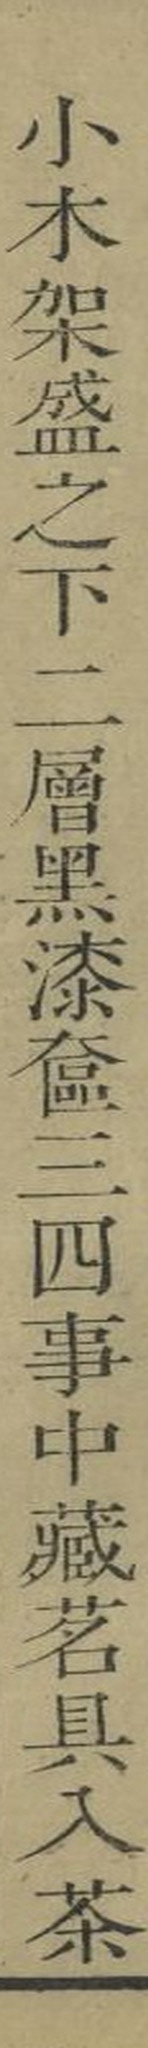小木架盛之下二層黒漆奩三四事中蔵茗具入茶
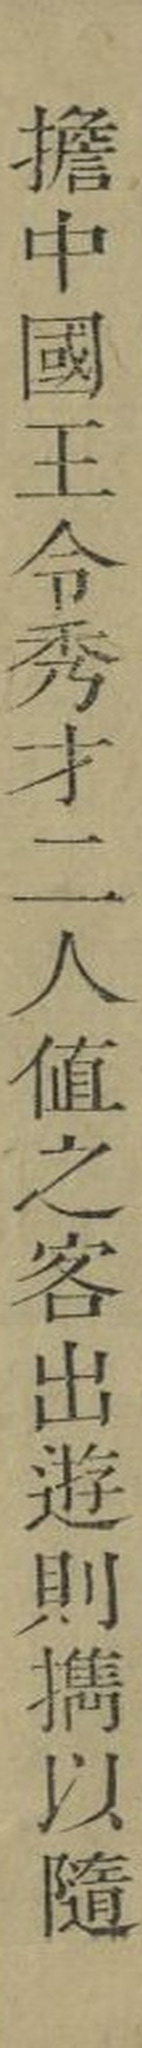担中国王令秀才二人値之客出遊則携以随
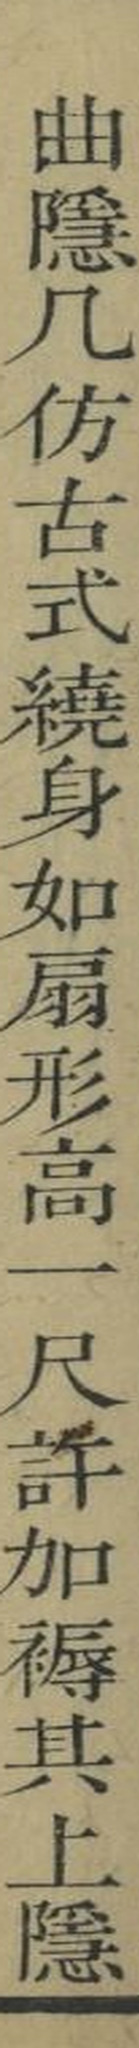曲隠几仿古式繞身如扇形高一尺許加褥其上隠
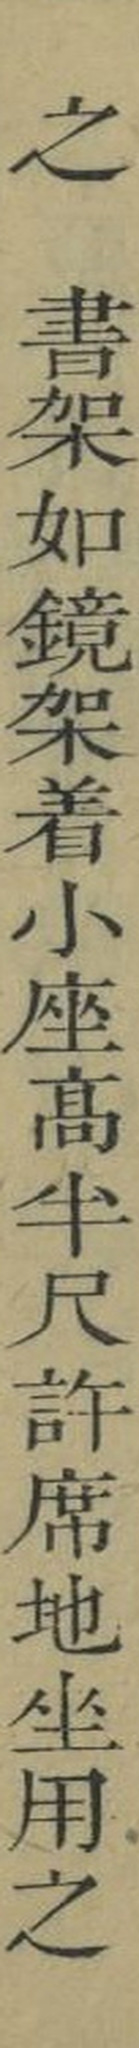之書架如鏡架着小座高半尺許席地坐用之

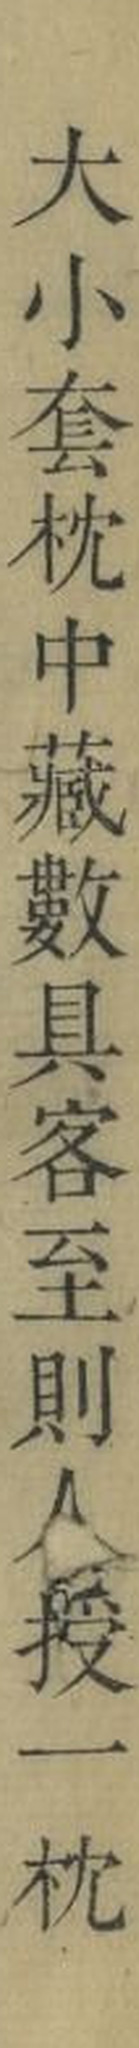大小套枕中蔵数具客至則人授一枕
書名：中山伝信録 巻六
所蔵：University of the Ryukyus Library
